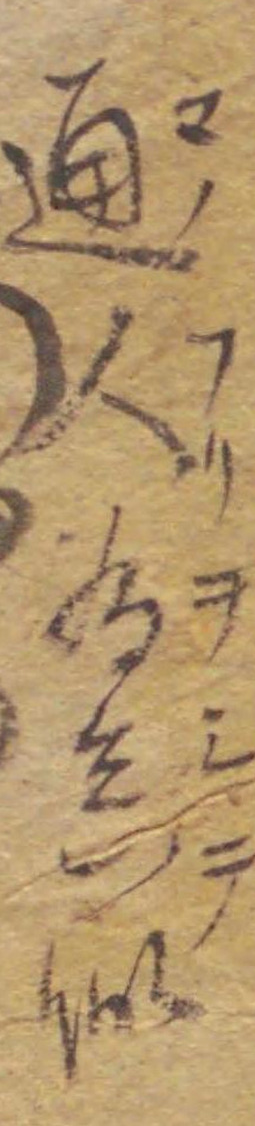通人為真似

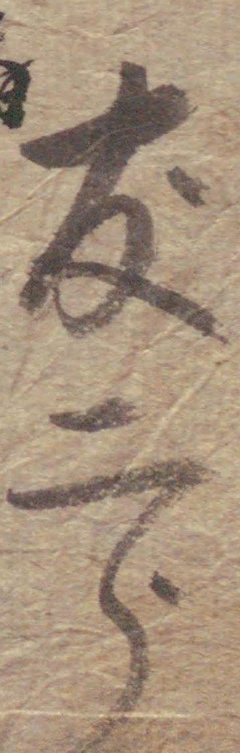友二郎

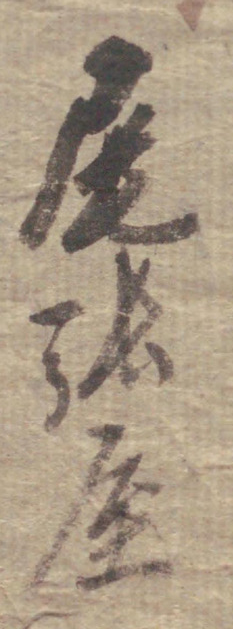尾張屋
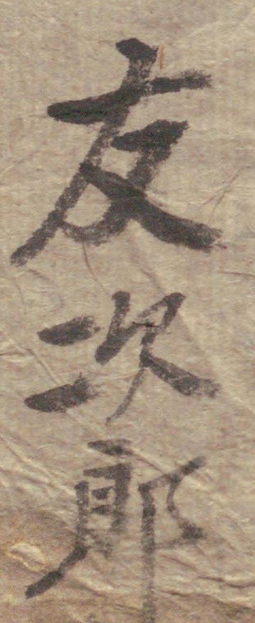友次郎
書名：通人為真似 : 2巻
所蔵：国立国会図書館 National Diet Library, JAPAN
